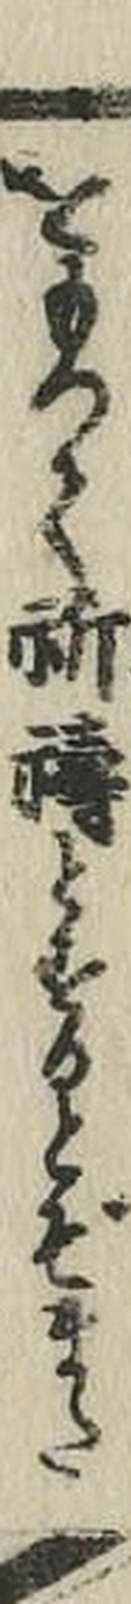をもつて祈祷とするとぞまた
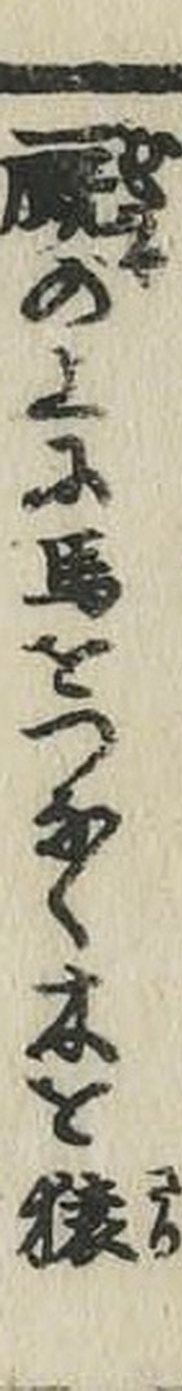厩の上に馬をつなく木を猿
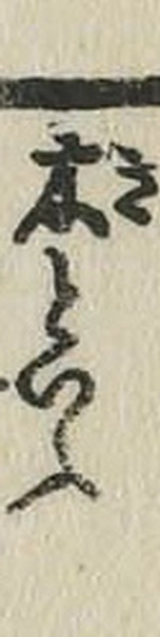木といふ
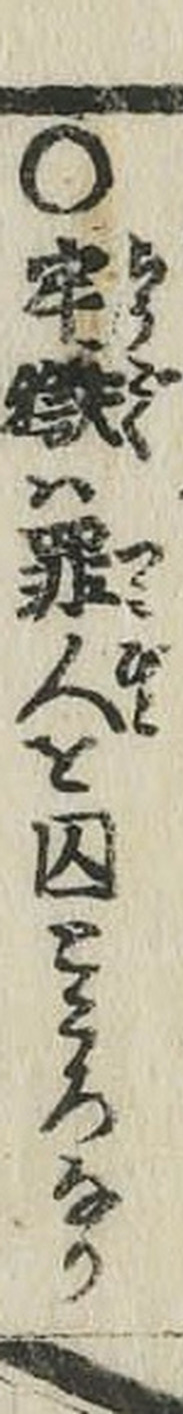○牢獄は罪人を囚ところなり
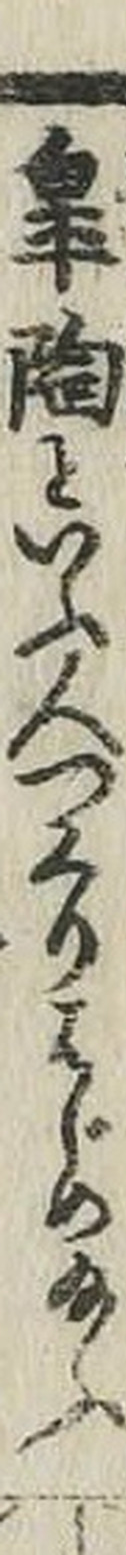皐陶といふ人つくりはじめ給ふ
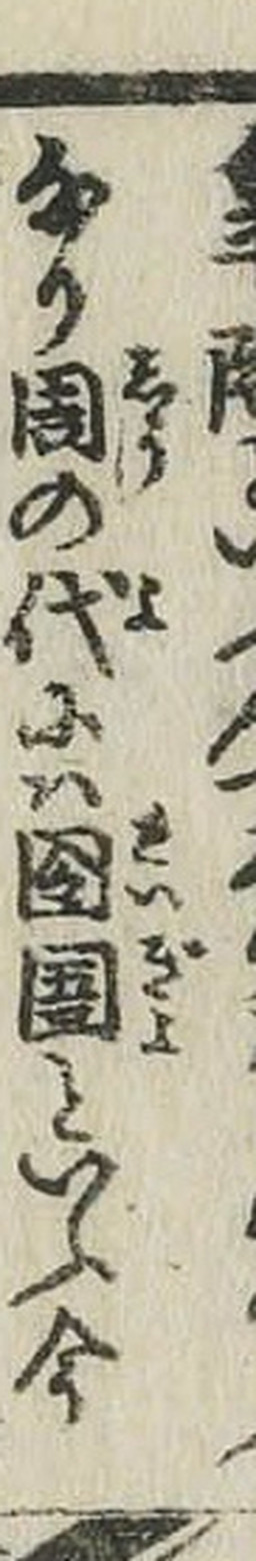なり周の代には囹圄といふ今
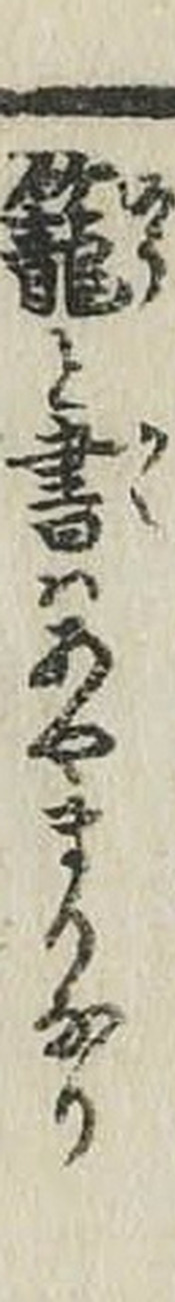籠と書はあやまりなり
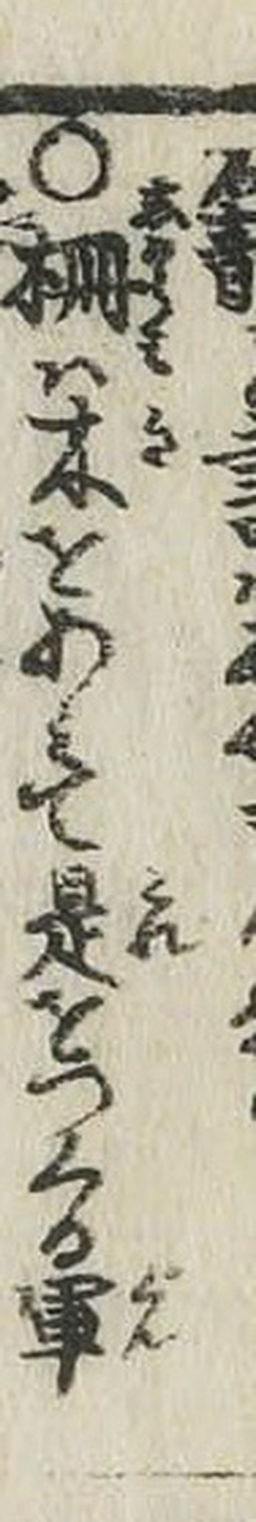○柵は木をあみて是をつくる軍
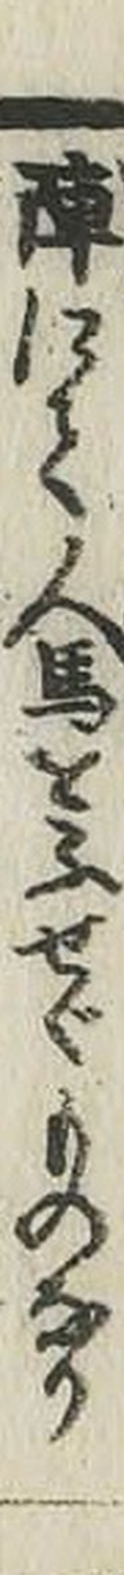陣にて人馬をふせぐものなり
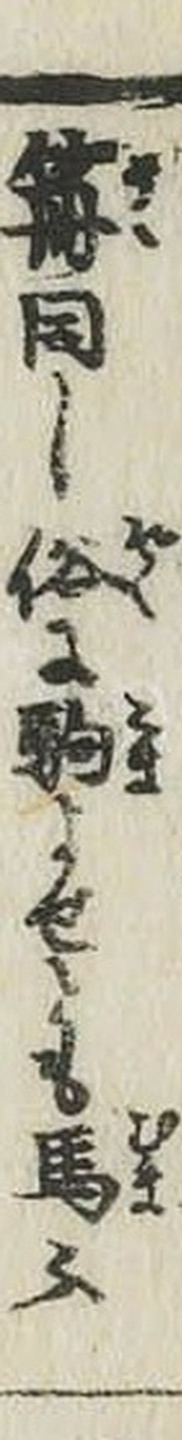笧同し俗に駒よせとも馬ふ
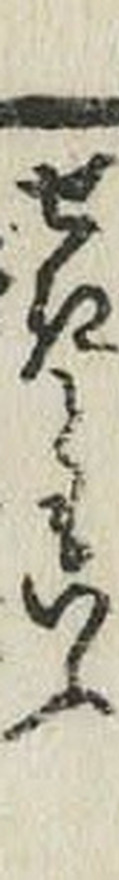せぎともいふ
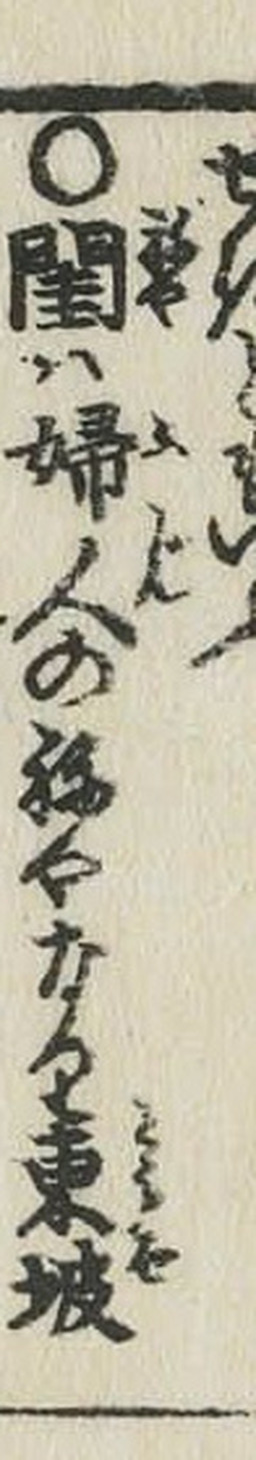○閨は婦人のねやなり東坡
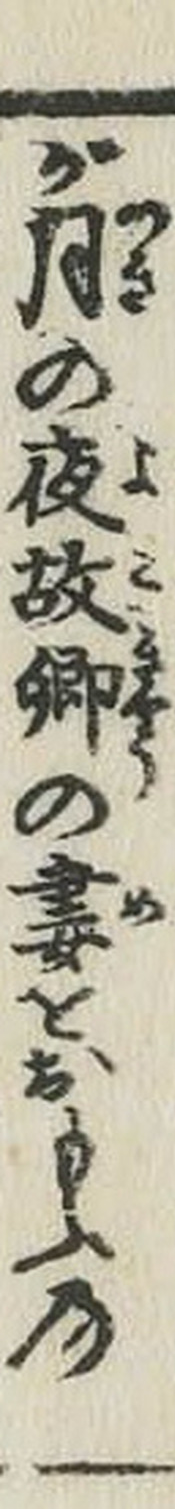が月の夜故郷の妻をおもふの
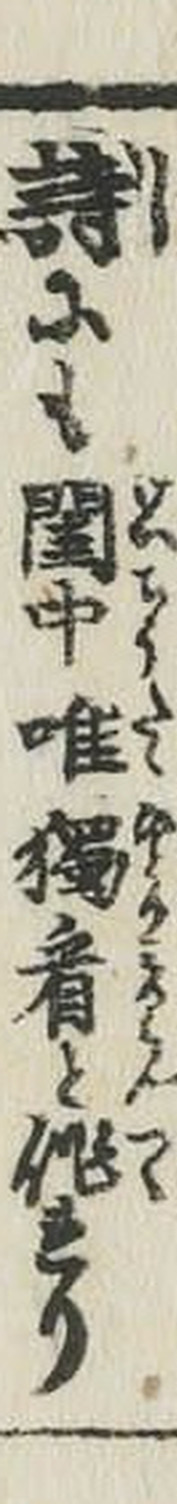詩にも閨中唯独看と作れり
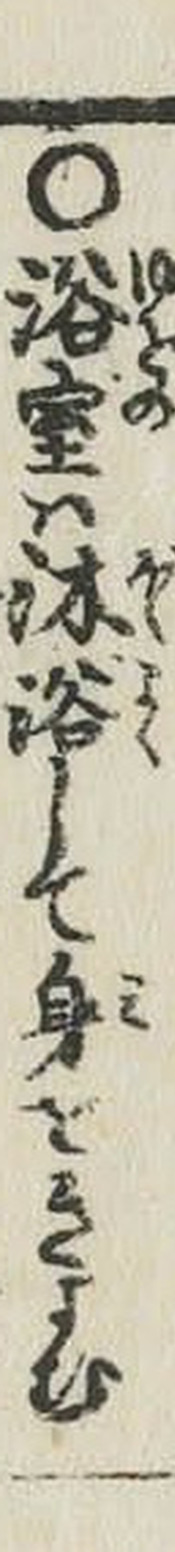○浴室は沐浴して身をきよむ
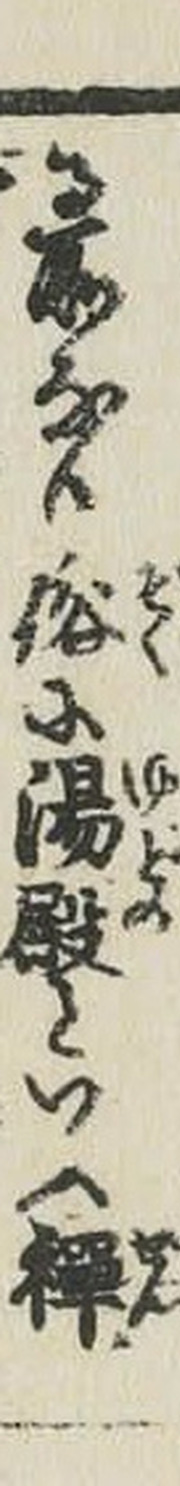る所なり俗に湯殿といふ禅
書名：増補頭書訓蒙図彙大成 10巻 2:巻之1-3
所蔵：東京学芸大学教育コンテンツアーカイブ
